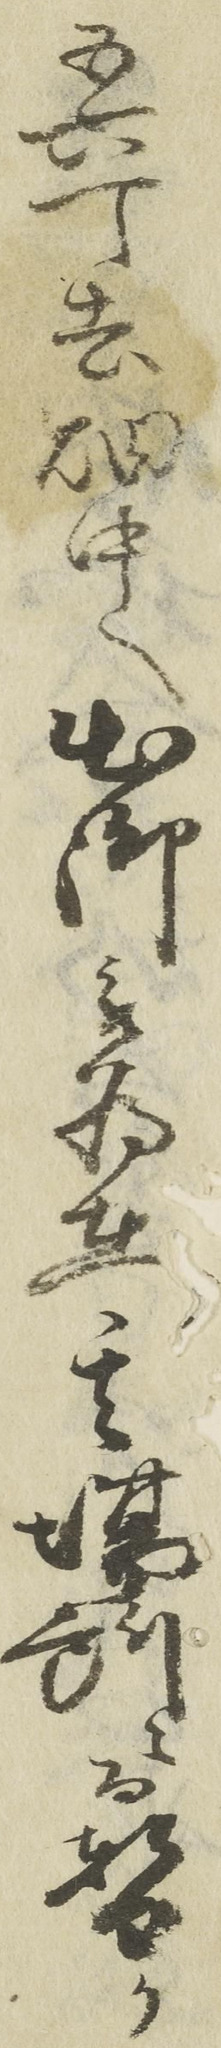五六丁去畑中へ出御被為在其場所ニ而暫ク
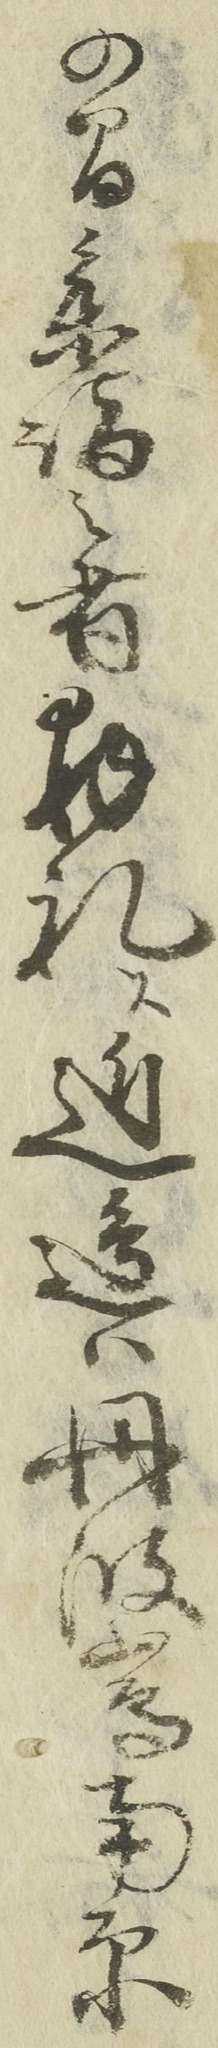の間参詣之者拝礼ス近辺ハ丹波嶋南原
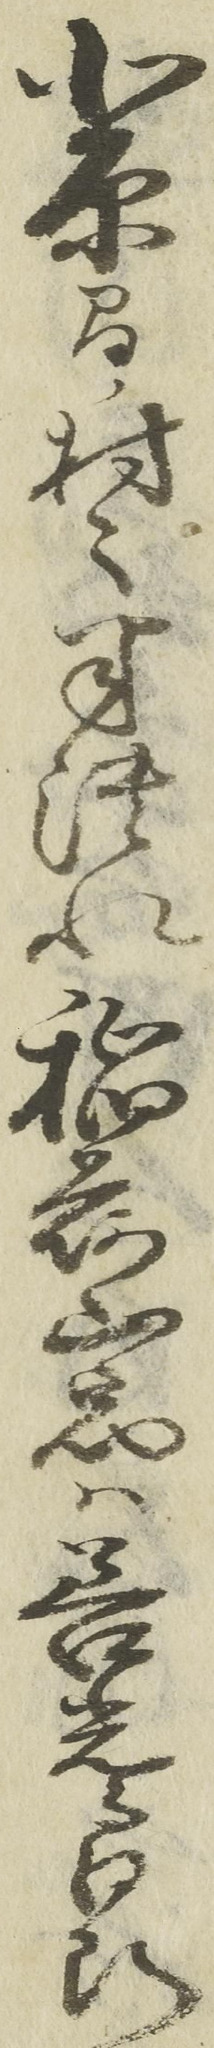北原間ノ村々半潰れ稲荷山宿ハ善光寺同断
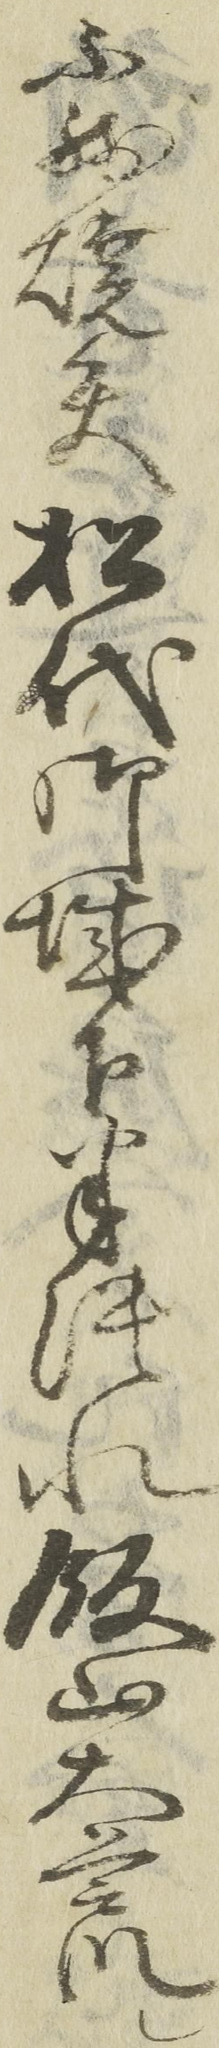不残焼失松代御城下半潰れ飯山大荒し
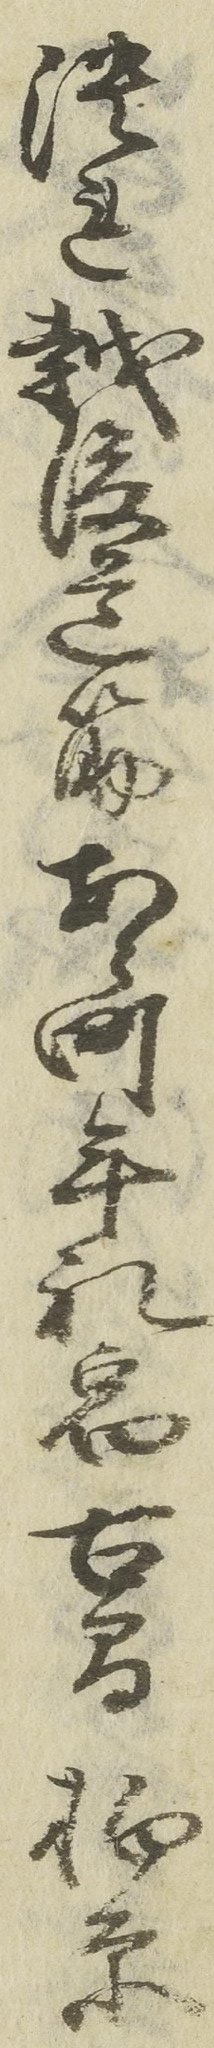潰れ越後道筋あら町牟礼宿古間柏原
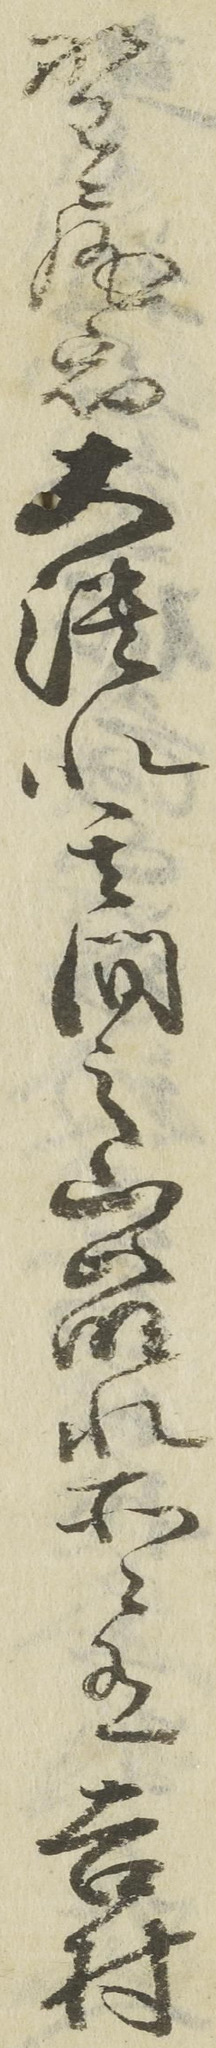野尻宿大潰れ其間之山崩れ所々有吉村
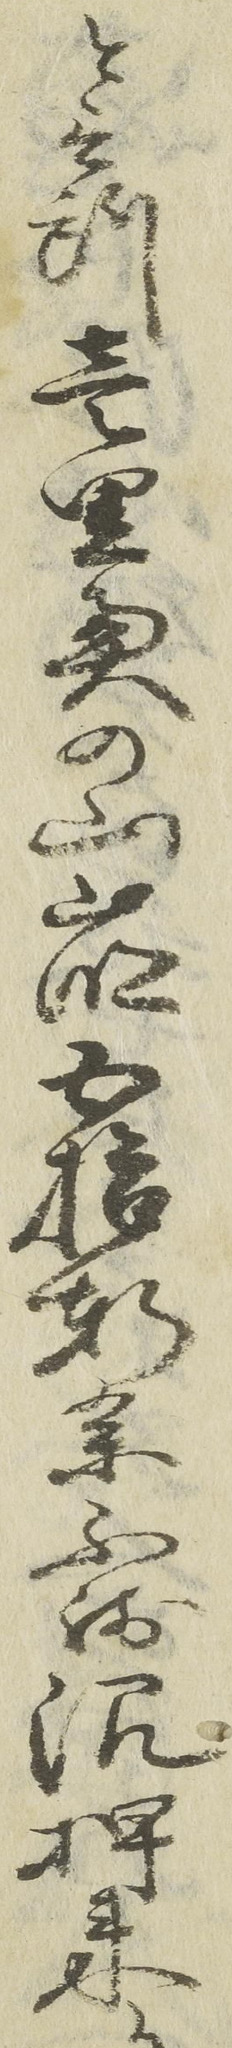と言所壱里奥の山崩五拾軒余不残泥押来り
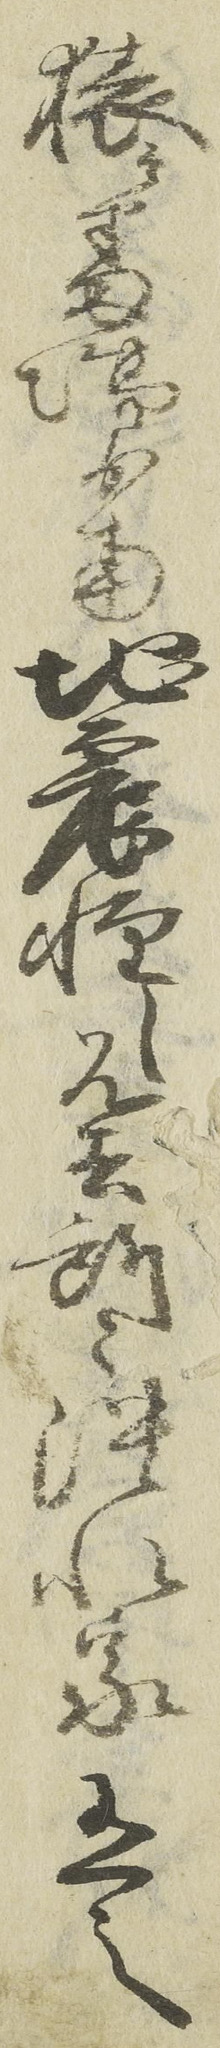猿ヶ番所ゟ南地震軽し乍去所々潰れ家有之
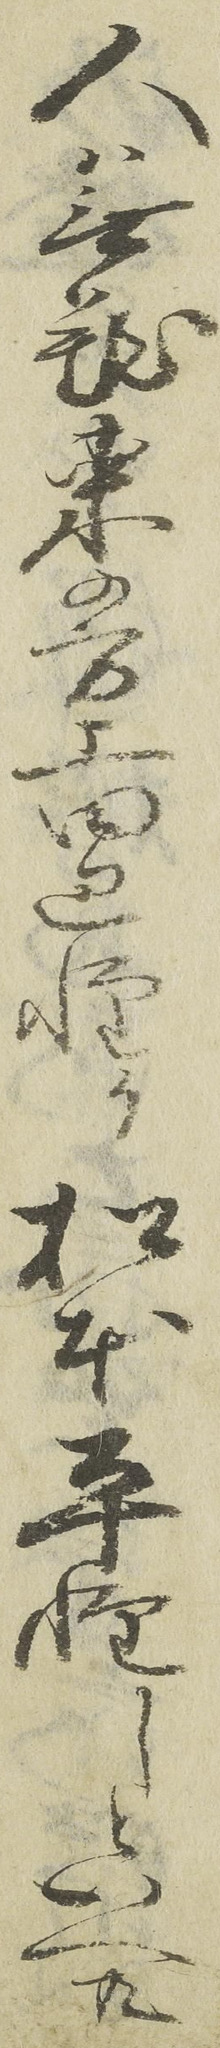人ハ無難東の方上田迄軽ク松本平軽しといへ共

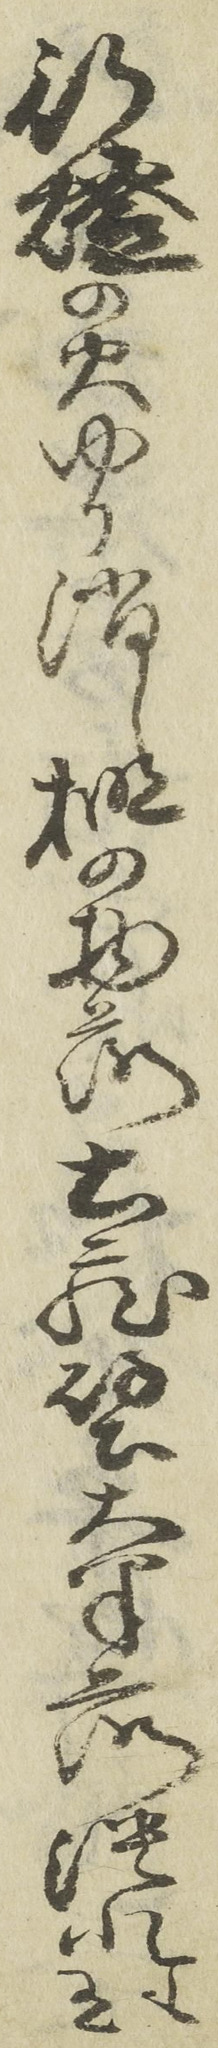行燈の火ゆり消し棚の物落土蔵壁大半落潰れも有
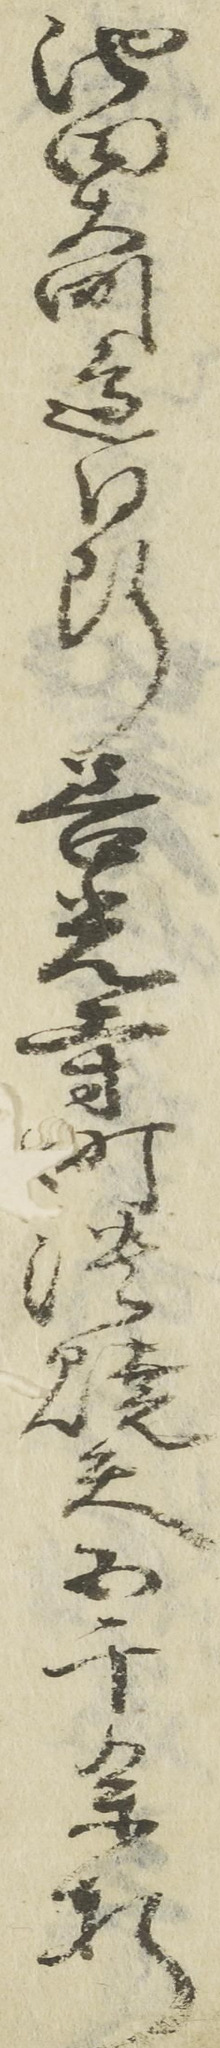池田大町辺同断善光寺町潰焼失五千余軒
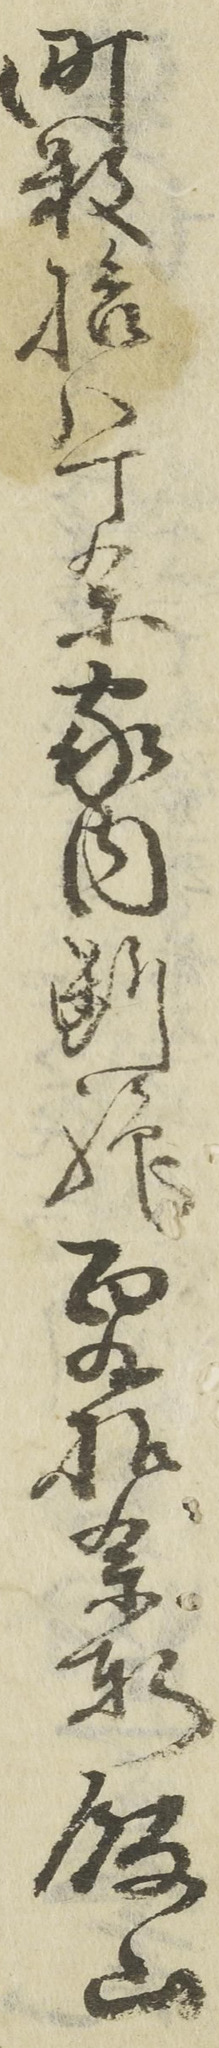町数拾八丁余家内断絶百九拾余軒飯山
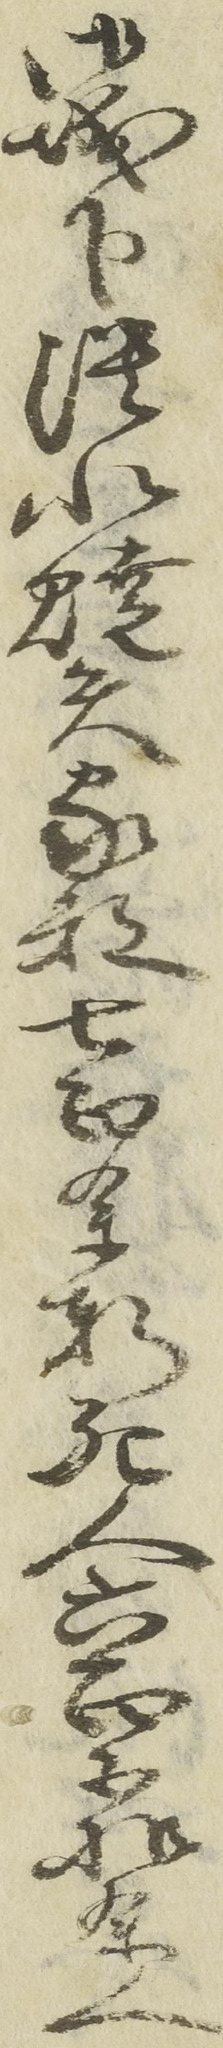御城下潰れ焼失家数七百余軒死人六百五拾余人
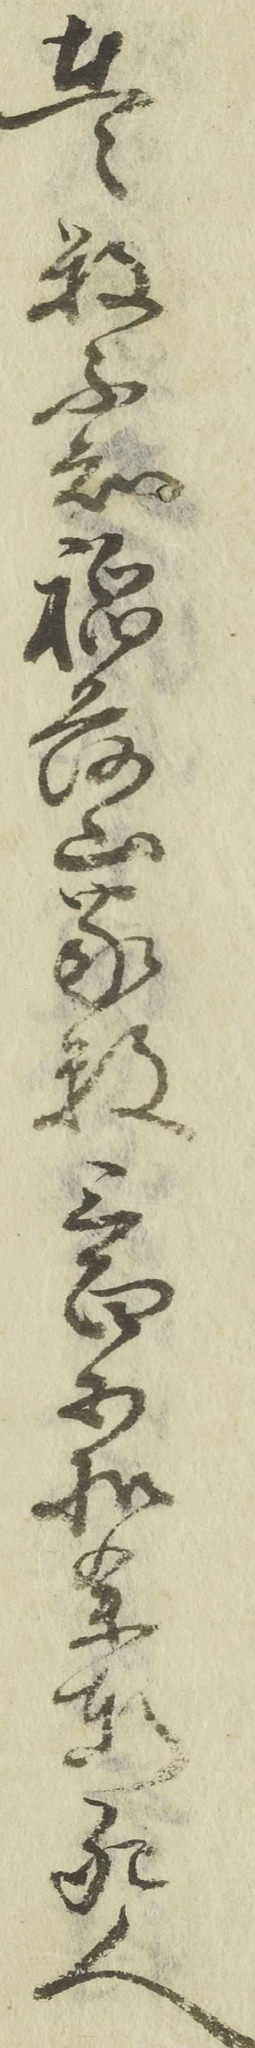在々数不知稲荷山家数三百五拾余軒死人
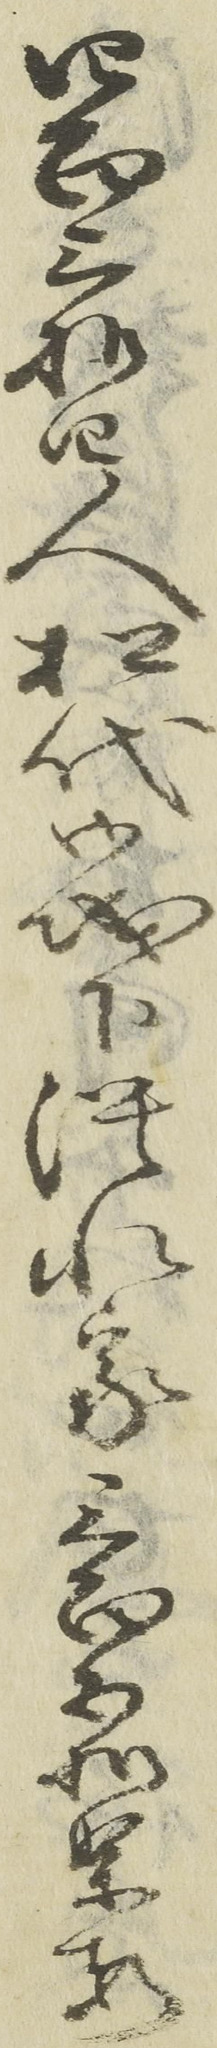四百三拾四人松代御城下潰れ家三百五拾余軒
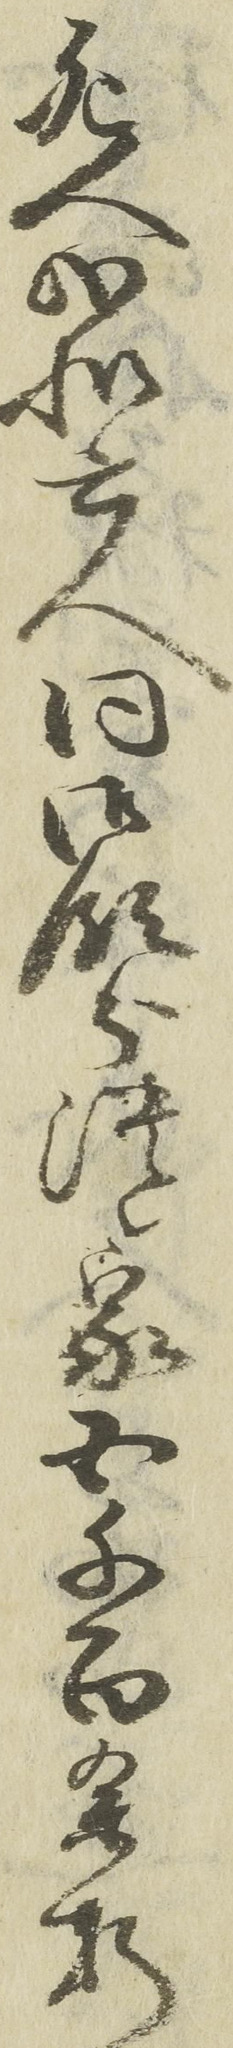死人弐拾六人同御領分潰レ家五千百余軒
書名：弘化四　大地震由来　全
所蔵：東京大学地震研究所図書室 Earthquake Research Institute Library, The University of Tokyo, JAPAN
